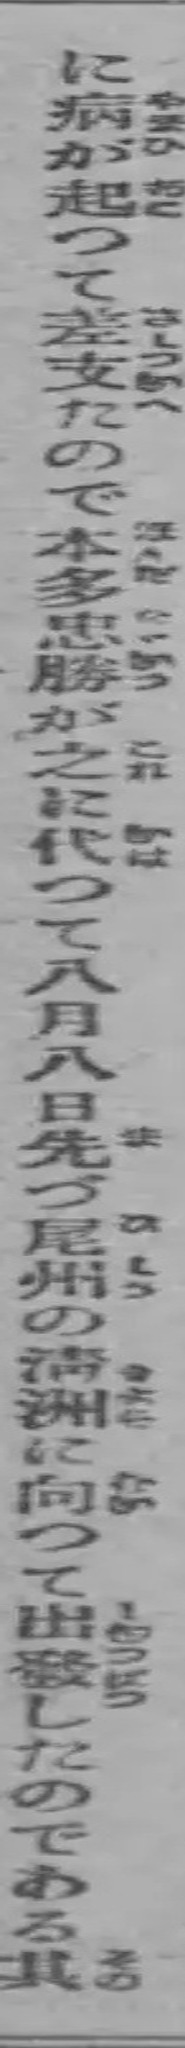に病が起つて差支たので本多忠勝が之に代つて八月八日先づ尾州の清洲に向つて出発したのである其

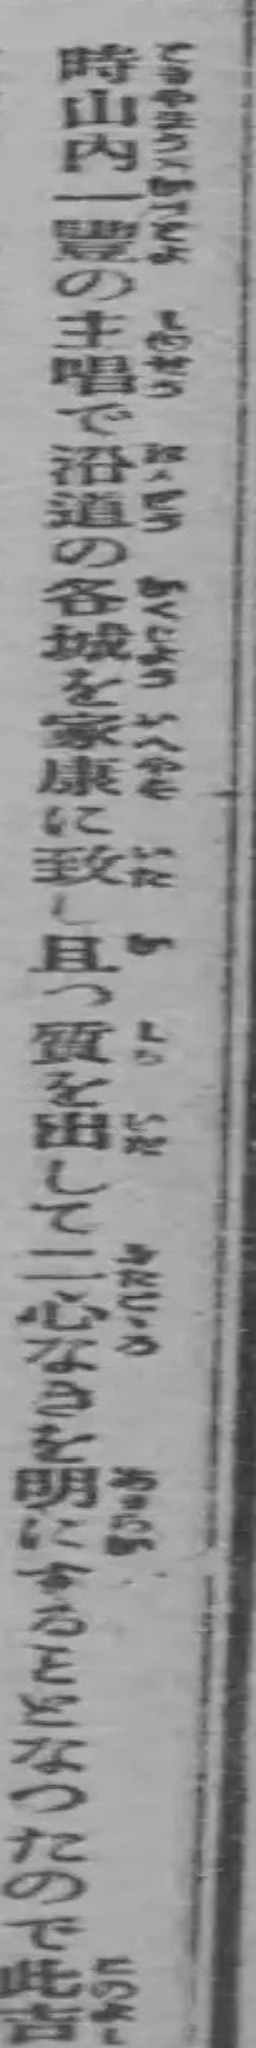松平家康時山内一豊の主唱で沿道の各城を家康に致し且つ質を出して二心なきを明にすることとなつたので此吉
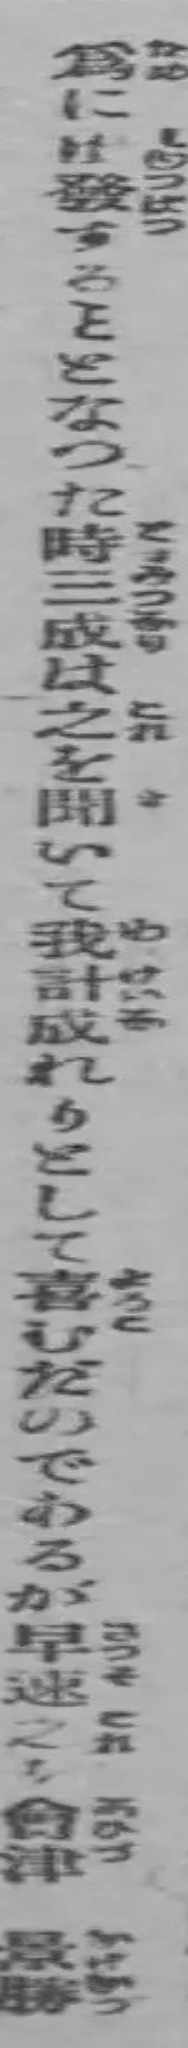為に出発することとなつた時三成は之を聞いて我計成れりとして喜むだのであるが早速之を会津の景勝
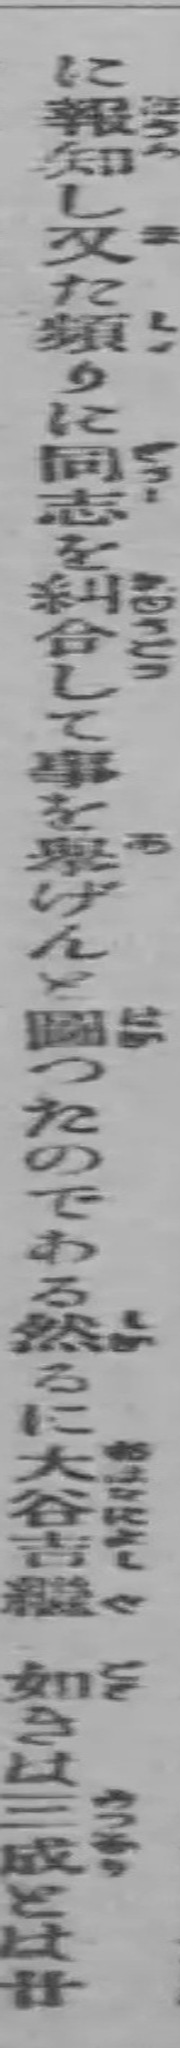に報知し又た頻りに同志を糾合して事を挙げんと図つたのである然るに大谷吉継の如きは三成とは廿
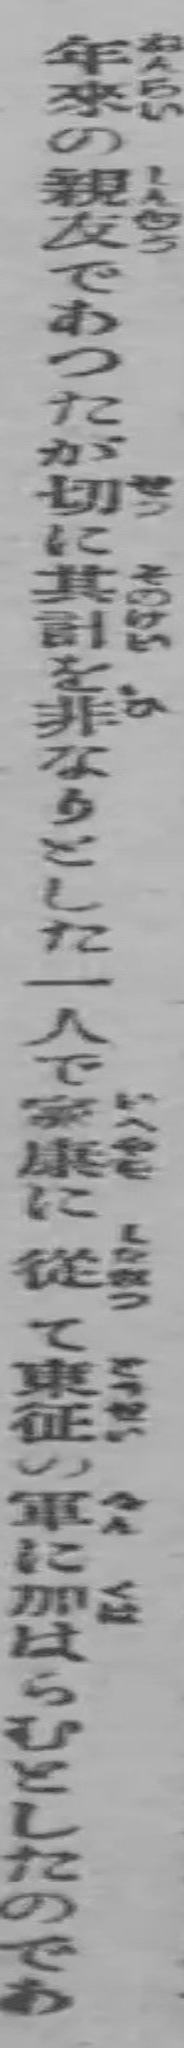大谷吉継年来の親友であつたが切に其計を非なりとした一人で家康に従て東征の軍に加はらむとしたのであ
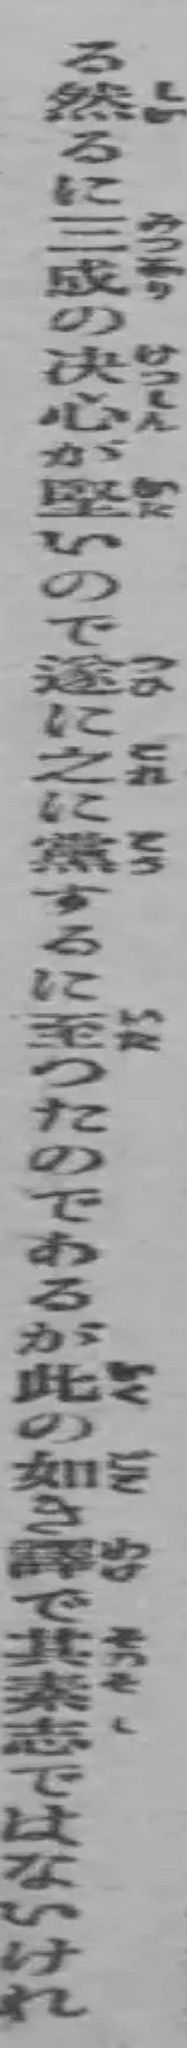る然るに三成の決心が堅いので遂に之に党するに至つたのであるが此の如き訳で其素志ではないけれ
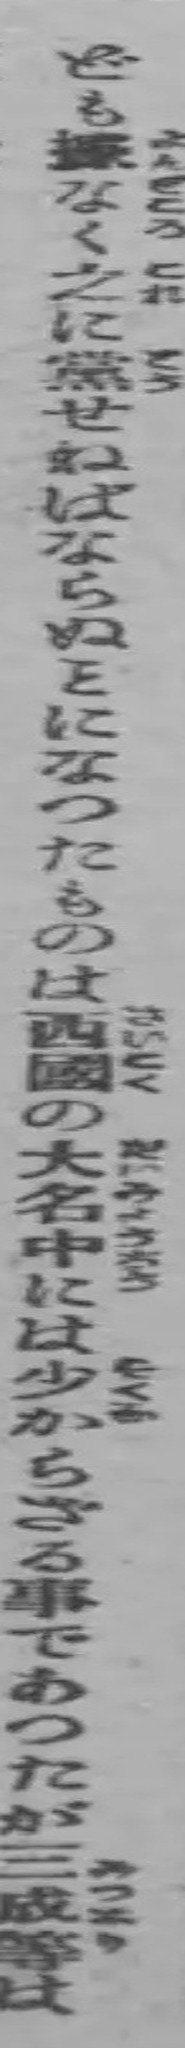ども拠なく之に党せねばならぬことになつたものは西国の大名中には少からざる事であつたが三成等は
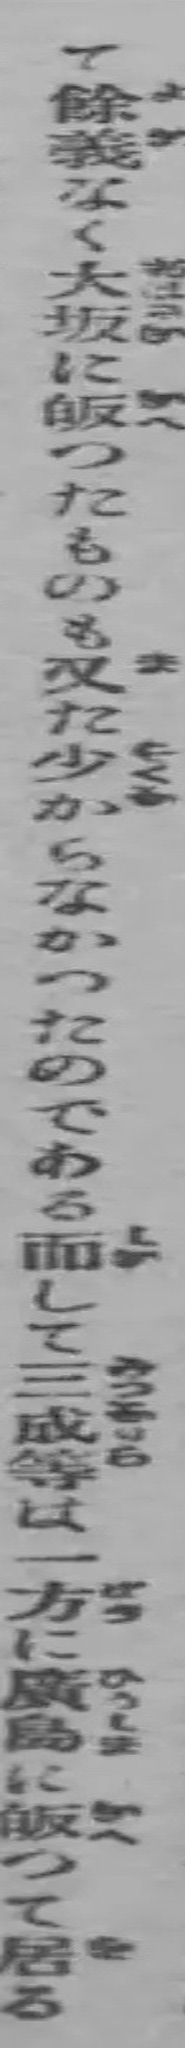くて余義なく大坂に皈つたものも又た少からなかつたのである而して三成等は一方に広島に皈つて居る
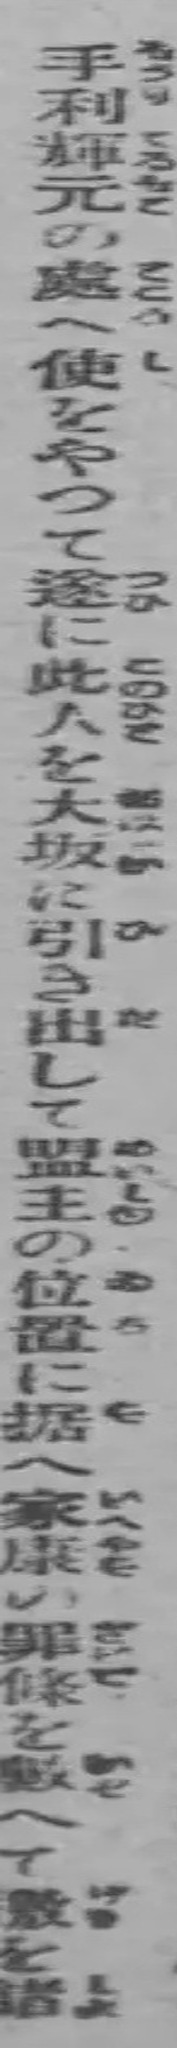毛利輝元毛利輝元の処へ使をやつて遂に此人を大坂に引き出して盟主の位置に据へ家康の罪条を数へて檄を諸
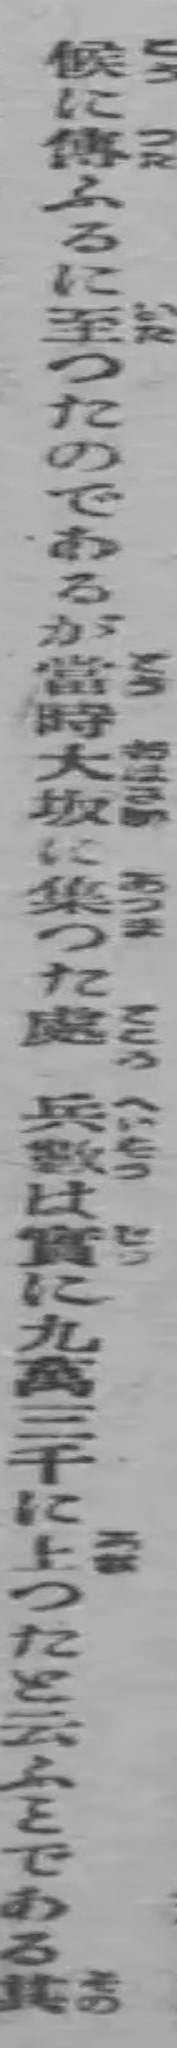侯に伝ふるに至つたのであるが当時大坂に集つた処の兵数は実に九万三千に上つたと云ふことである其
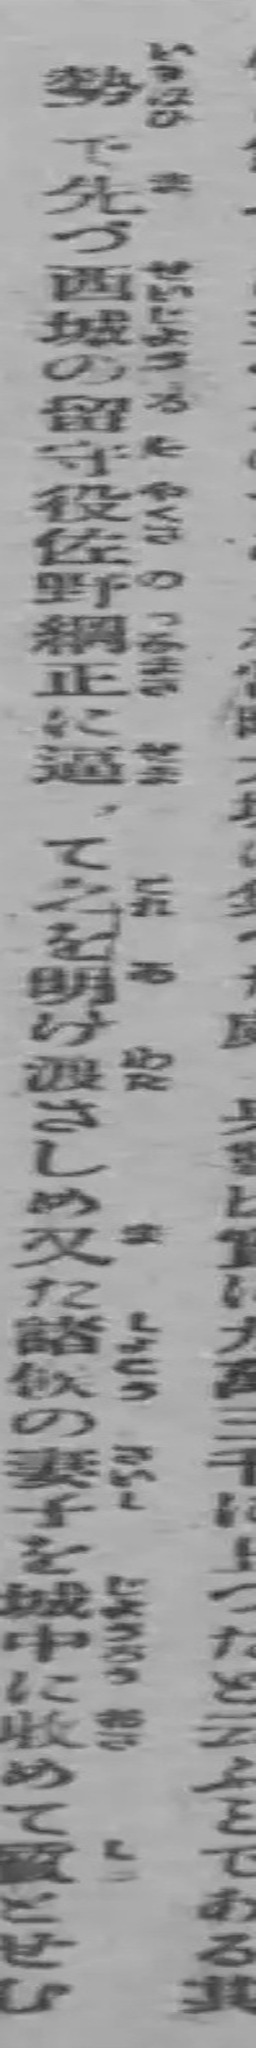勢で先づ西城の留守役佐野綱正に逼つて之を開け渡さしめ又た諸侯の妻子を城中に収めて質とせむ
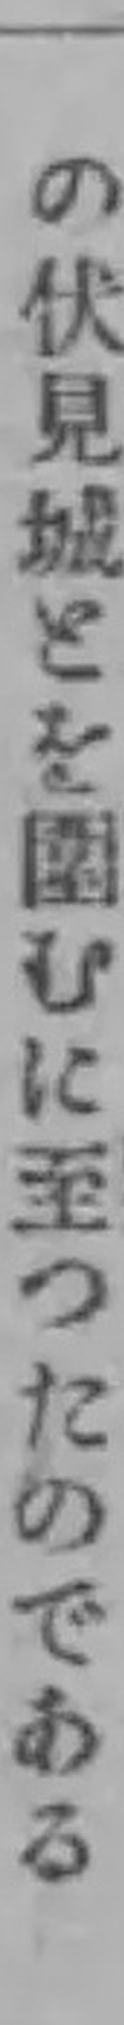の伏見城とを囲むに至つたのである
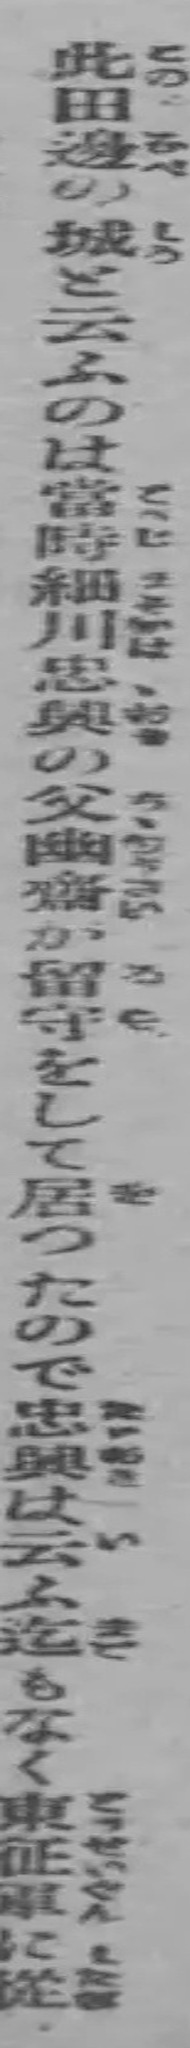此田辺の城と云ふのは当時細川忠興の父幽斉か留守をして居つたので忠興は云ふ迄もなく東征軍に従
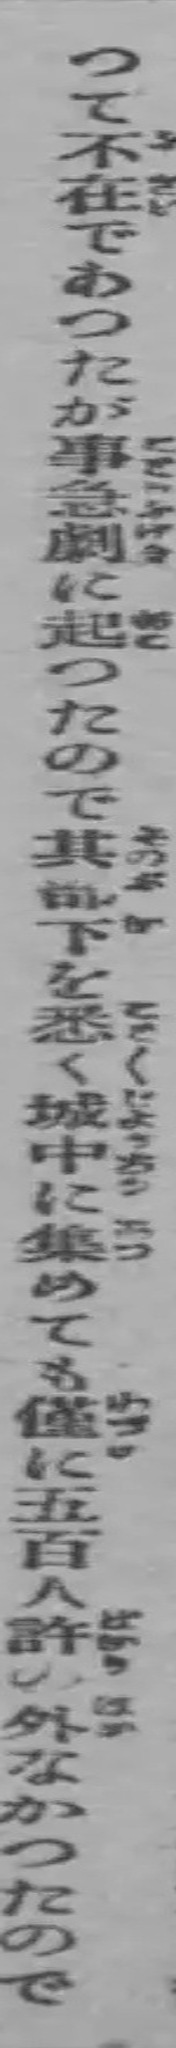つて不在であつたが事急劇に起つたので其部下を悉く城中に集めて僅に五百人許の外なかつたので
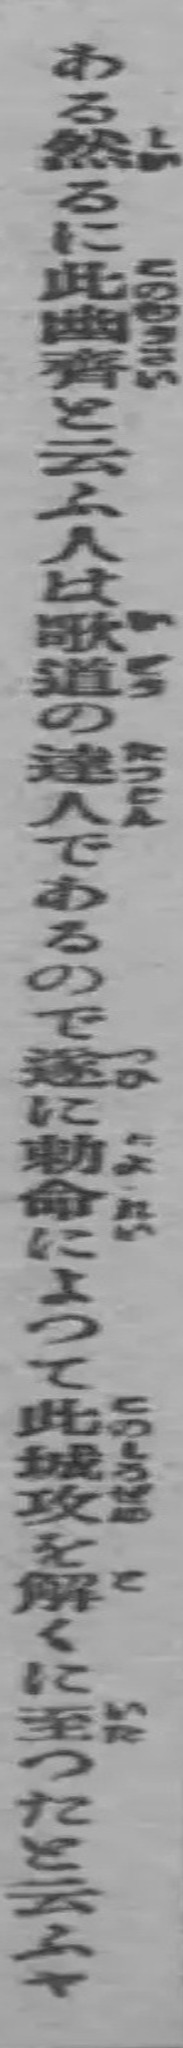ある然るに此幽斉と云ふ人は歌道の達人であるので遂に勅命によつて此城攻を解くに至つたと云ふヤ
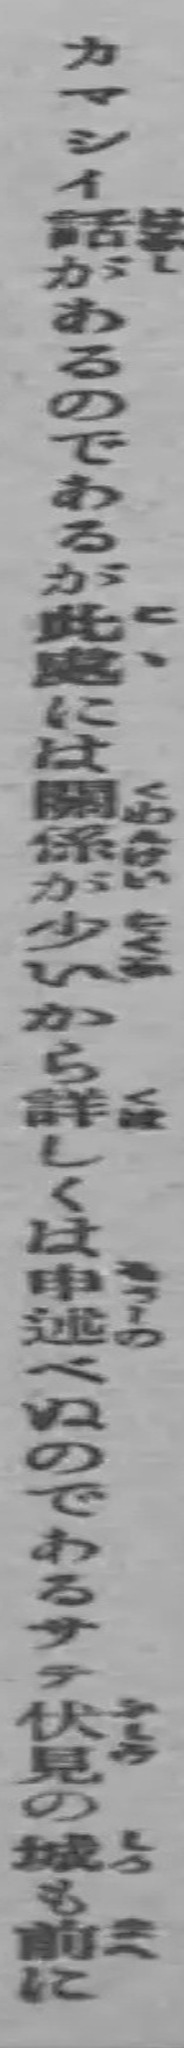カマシイ話があるのであるが此処には関係が少いから詳しくは申述べぬのであるサテ伏見の城も前に
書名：豊橋市史談
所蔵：国立国会図書館 National Diet Library, JAPAN
